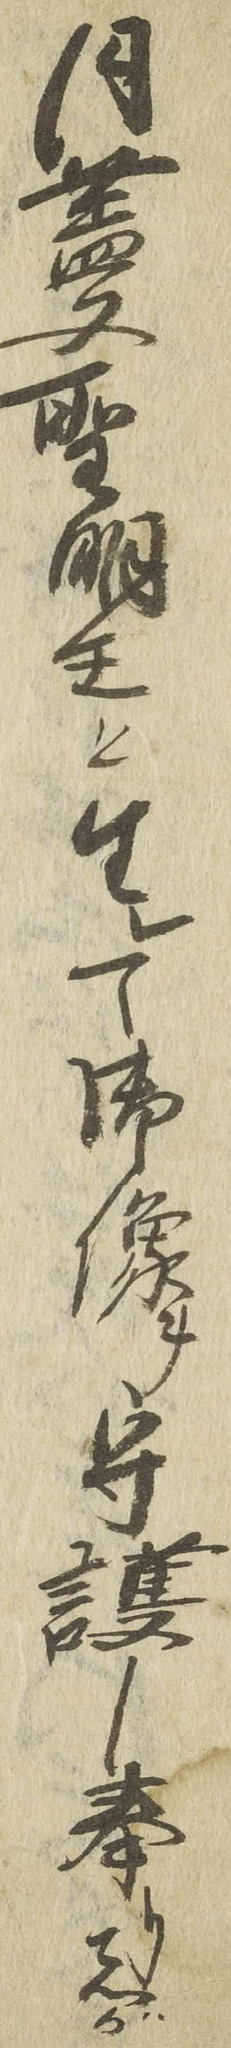月蓋又聖明王と生レて御像ヲ守護し奉りしが
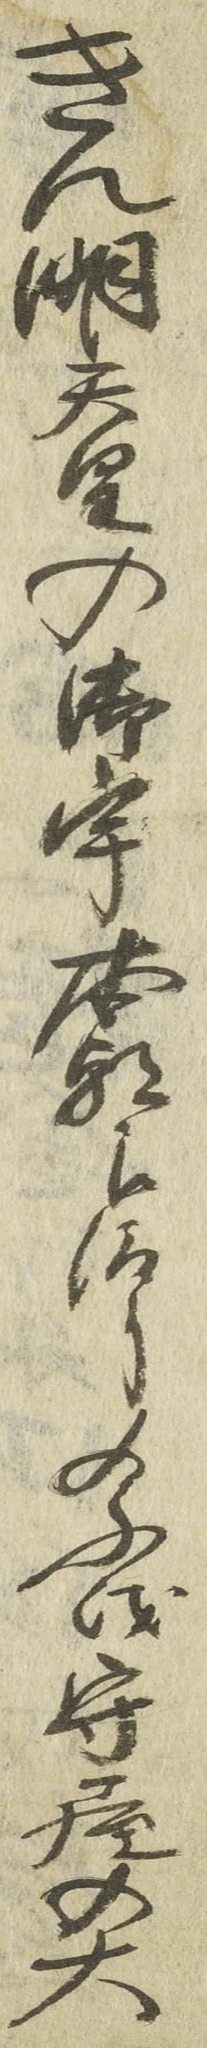きん明天皇の御宇本朝江渡り給ふを守屋の大
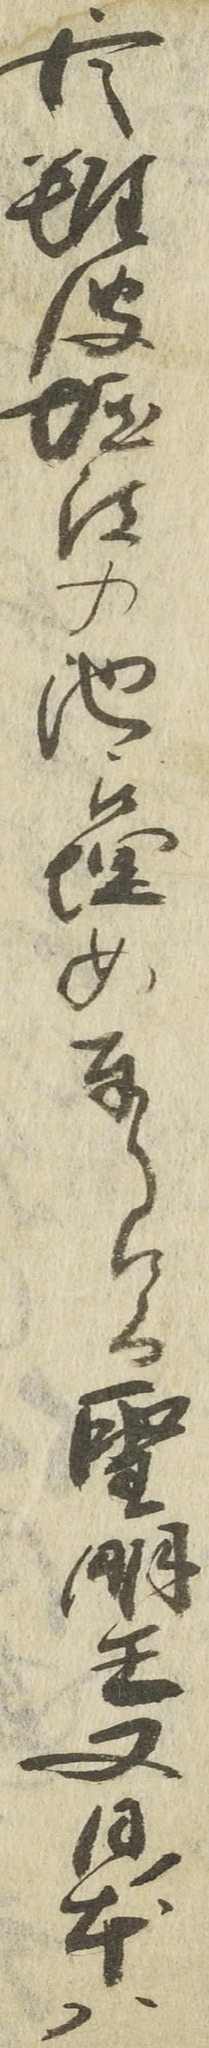臣難波堀江の池江埋め奉りける聖明王又日ノ本は
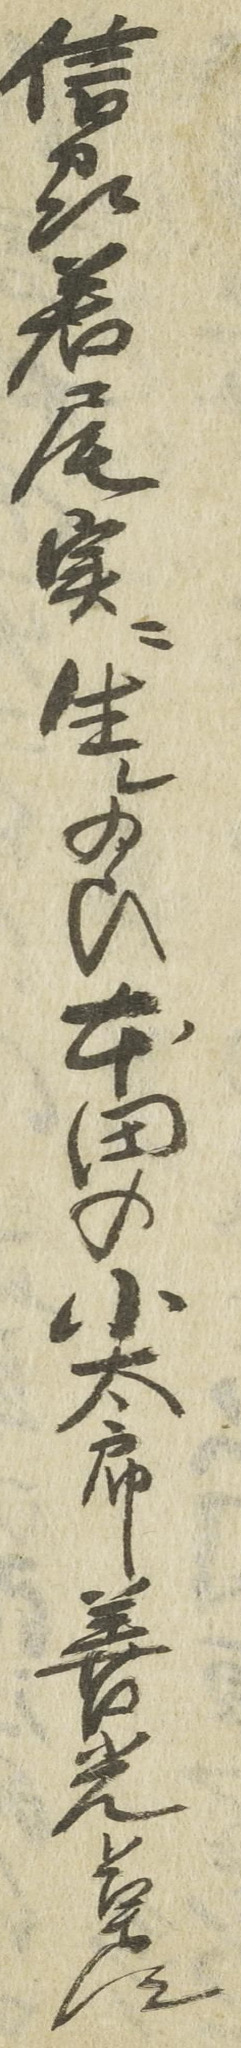信州若尾実ニ生レ給ひ本田の小太郎善光尊位
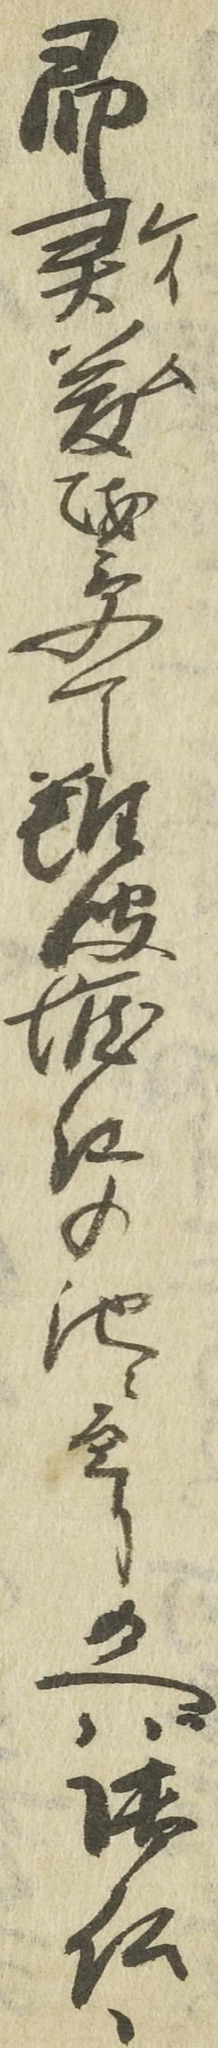即霊夢を受て難波堀江の池ニ至り給へば御仏ノ
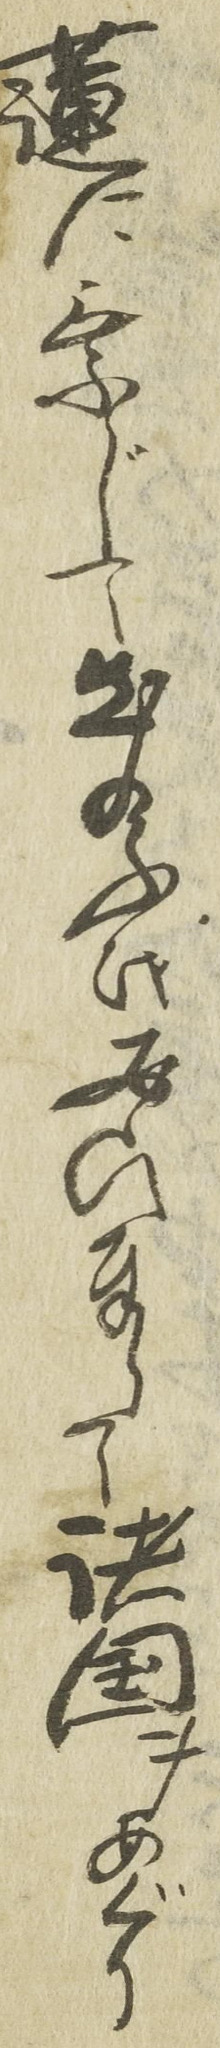蓮に乗じて出給ふをおひ奉りて諸国ヲめぐり
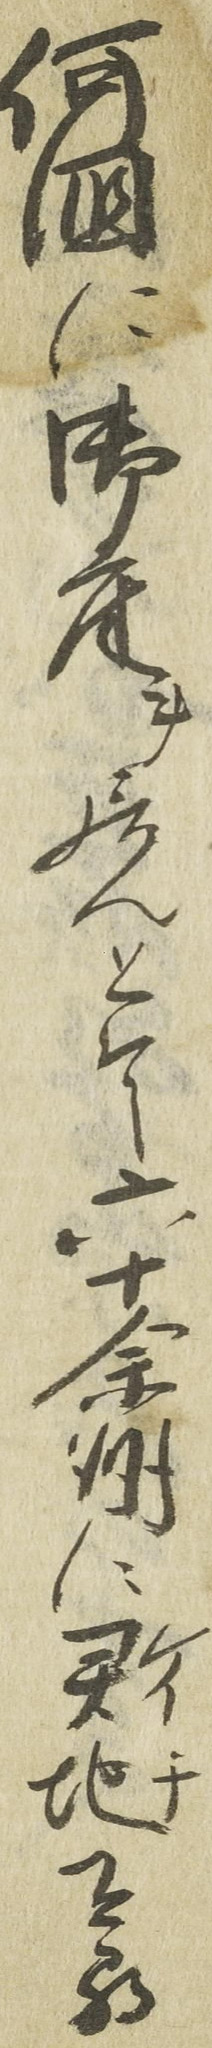何国に御座ヲ居んとて六十余州に霊地を尋
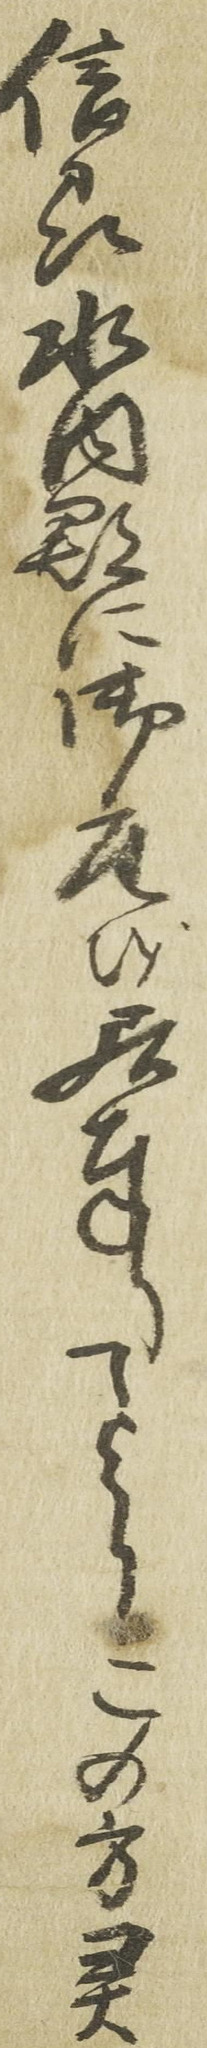信州水内郡に御座を居奉りてよりこの方霊
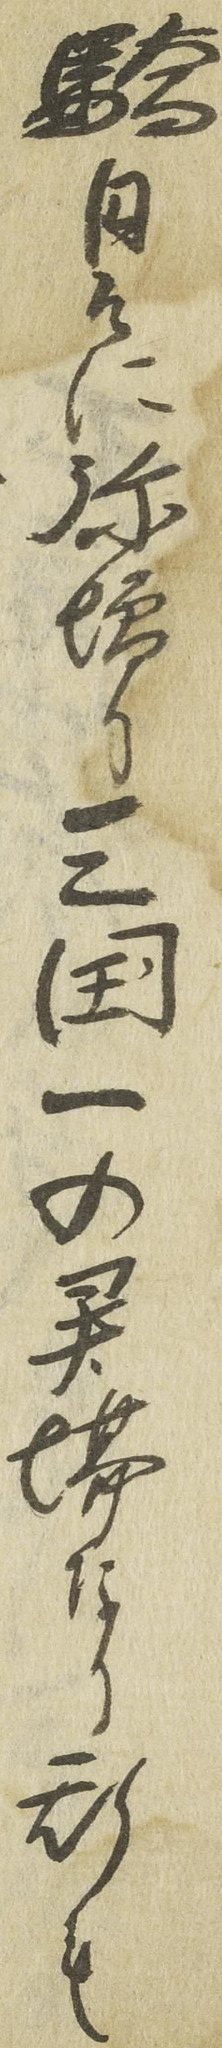験日々に弥増り三国一の霊場なり斯も
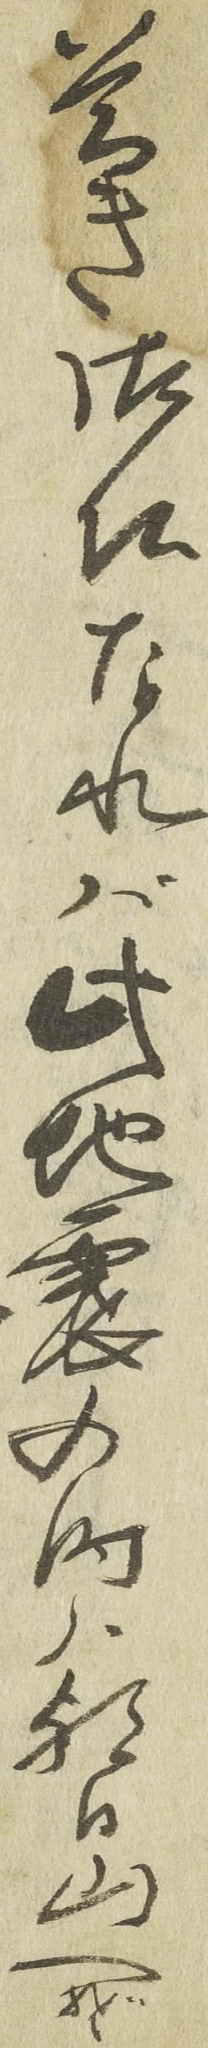尊き御仏なれば此地震の時は朝日山へぞ
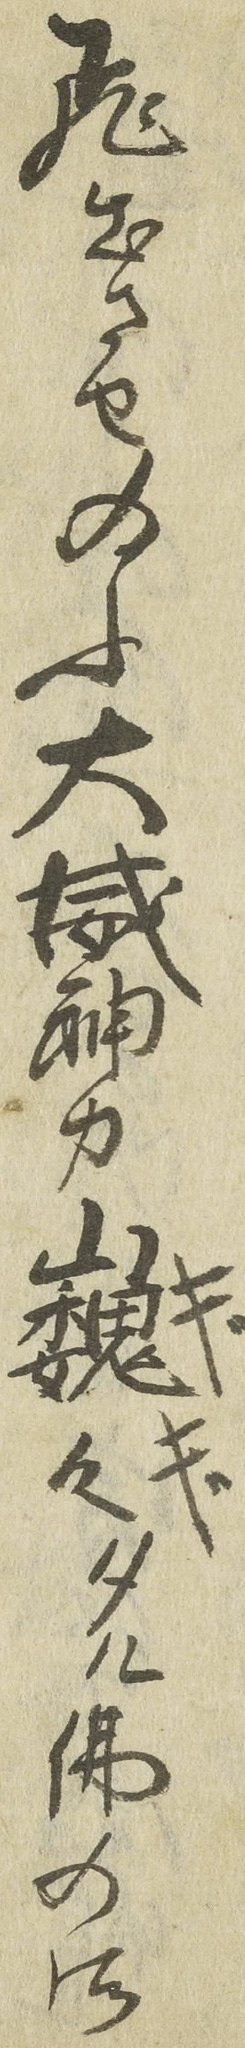飛出させ給ふ大威神力巍々タル仏の御
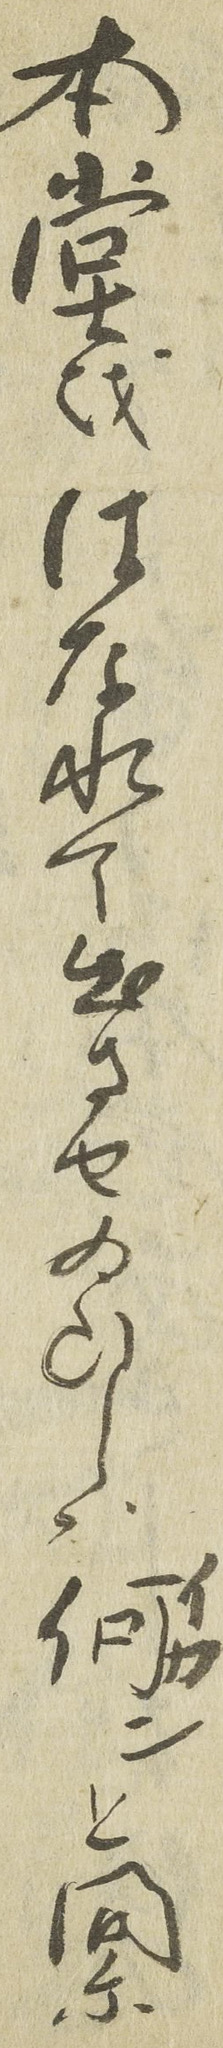本堂をはなれて出させ給ひしは何ンと問に
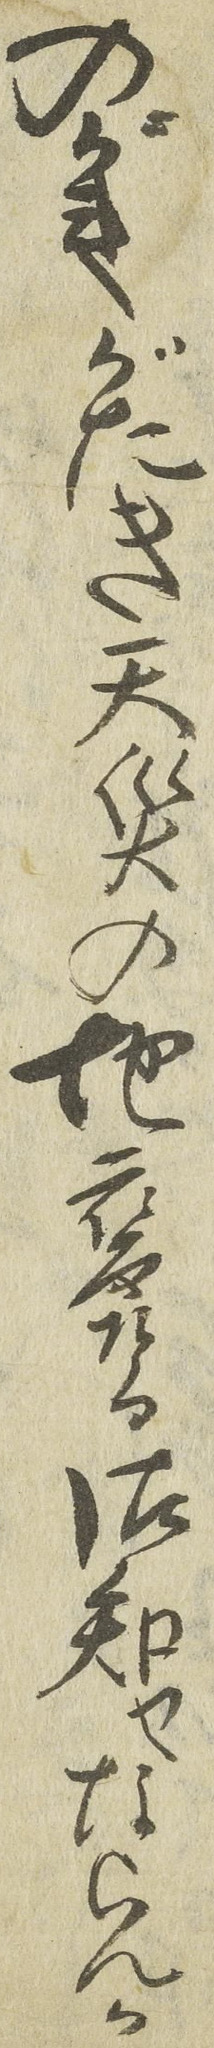のがれがたき天災の地変なる御知せならんか
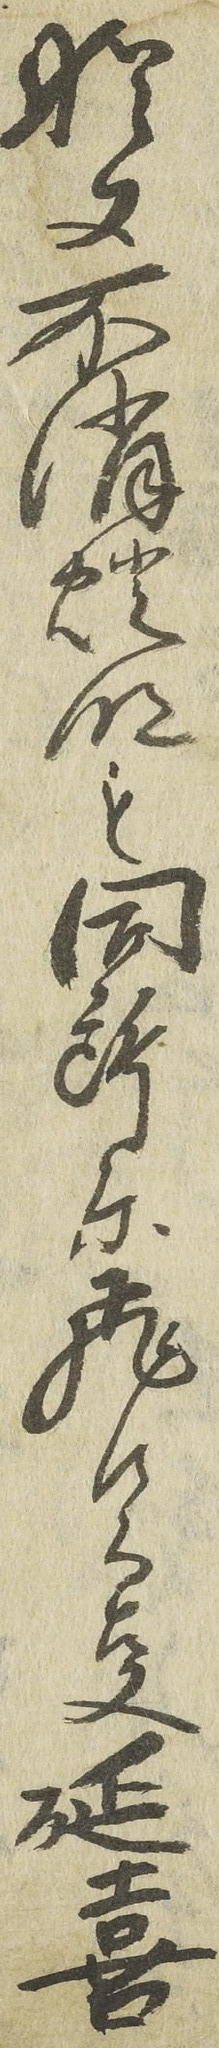猶又不消灯明も同所に飛ける事延喜
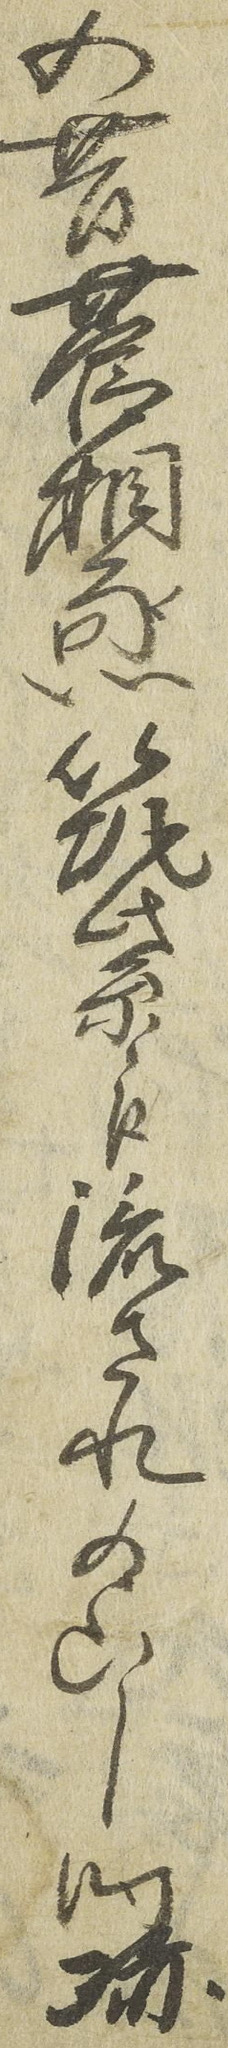の昔菅相丞筑紫江流され給ひし時跡
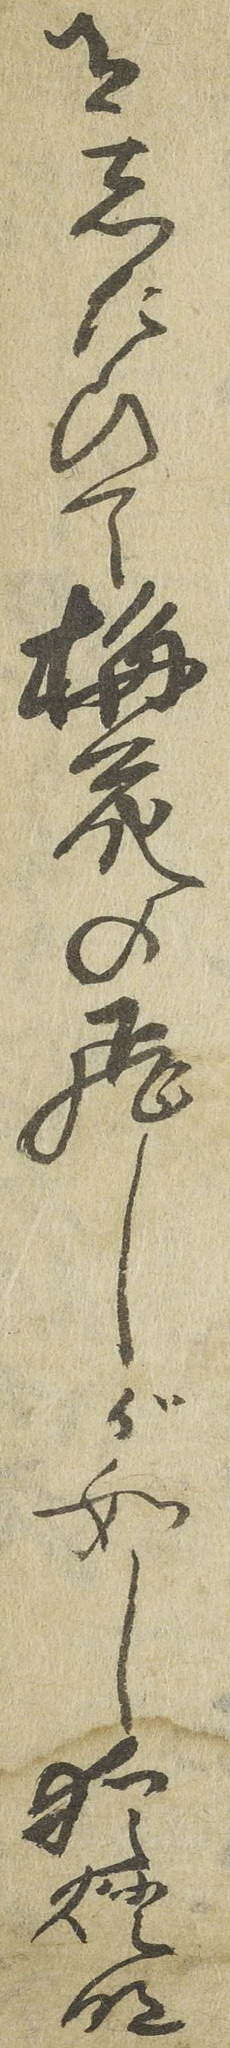をしたひて梅花の飛しが如し猶灯明
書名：善光寺地震聞書
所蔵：東京大学地震研究所図書室 Earthquake Research Institute Library, The University of Tokyo, JAPAN
